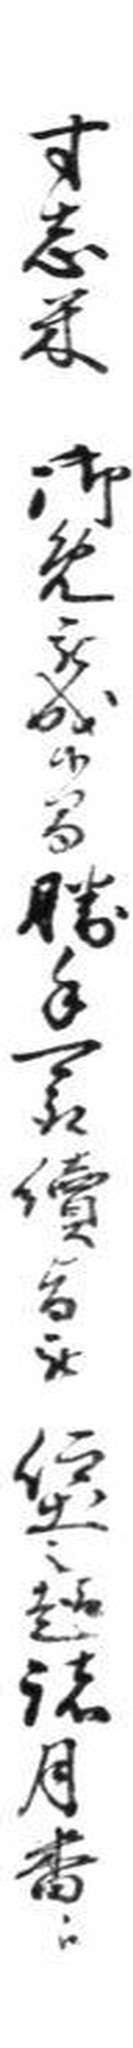寸志米御免被成候間勝手可取続旨被仰出趣諸月番江
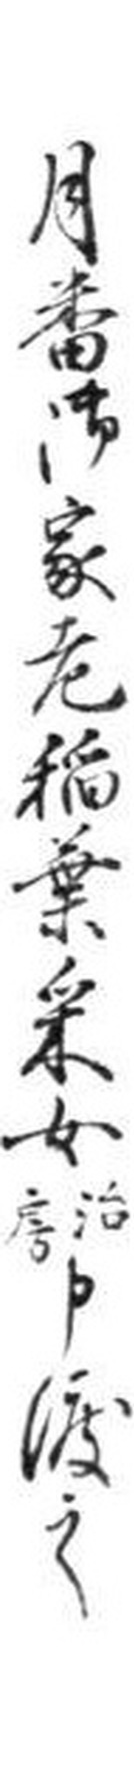月番御家老稲葉采女治房申渡之
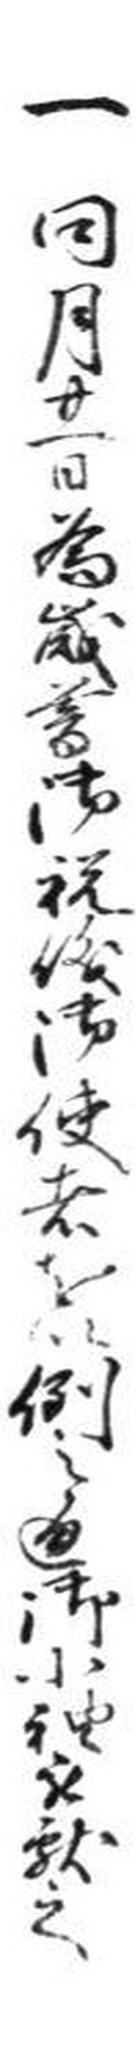一同月廿一日為歳暮御祝儀御使者を以例之通御小袖被献之
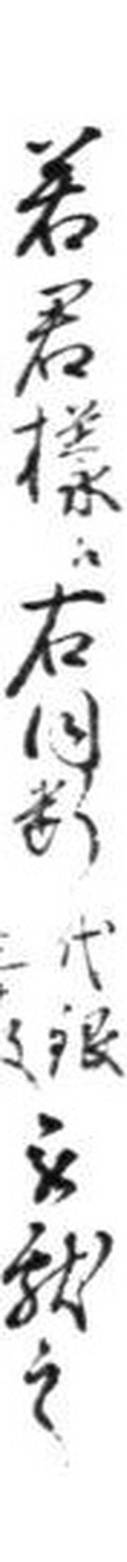若君様江右同断被献之
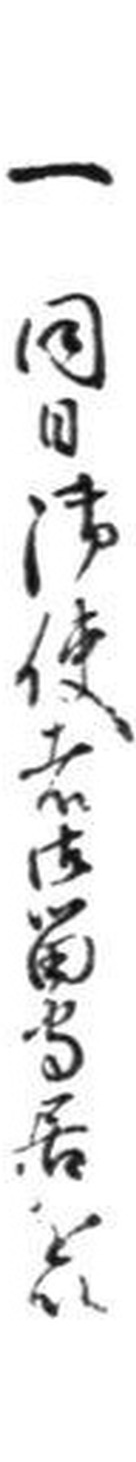一同日御使者御留守居を以
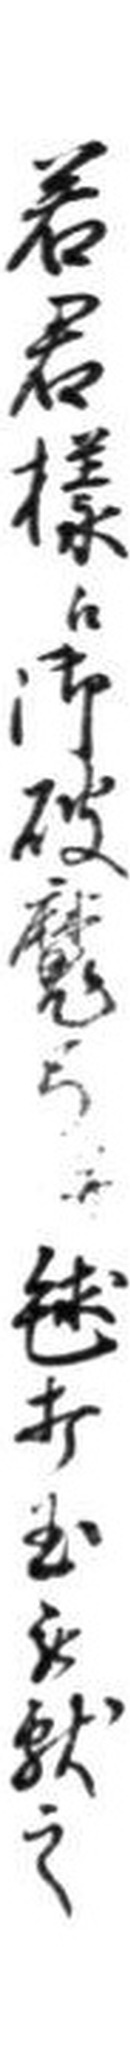若君様江御破魔弓并毬打玉被献之
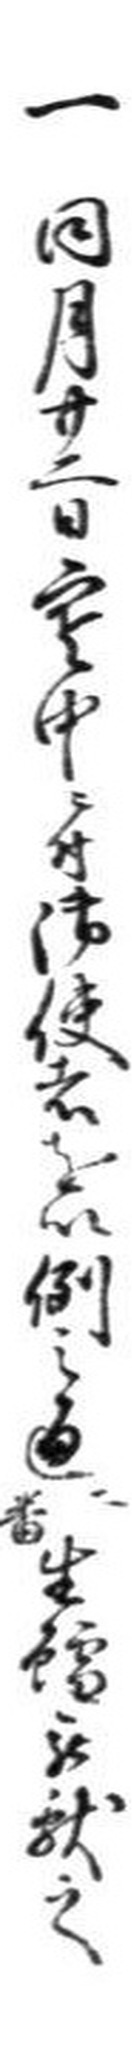一同月廿二日寒中ニ付御使者を以例之通ニ番生鱈被献之
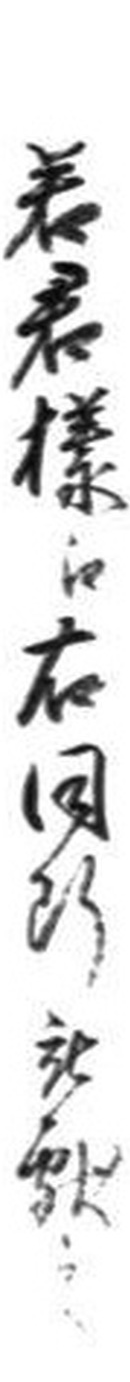若君様江右同断被献之

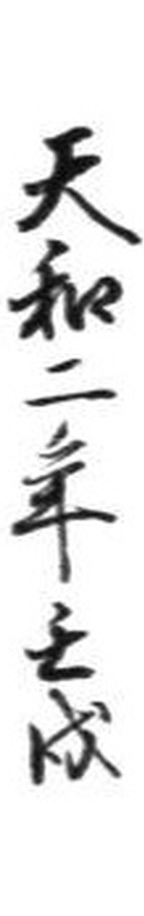天和二年壬戌
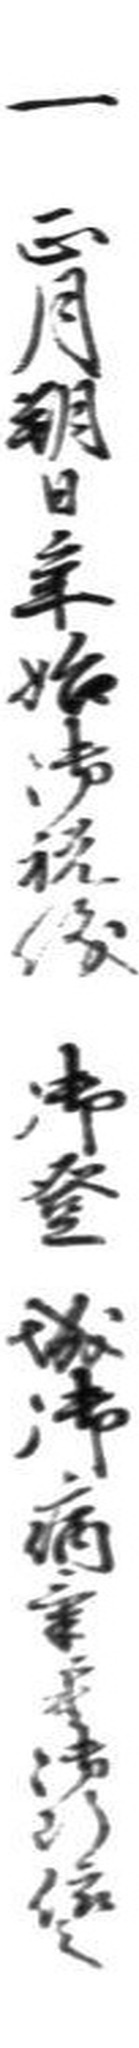一正月朔日年始御祝儀御登城御病気ニ付御断依之
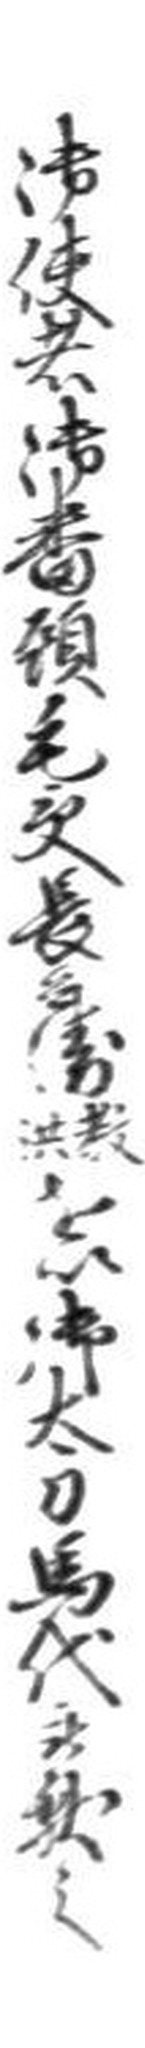御使者御番頭毛受長兵衛教洪を以御太刀馬代被献之
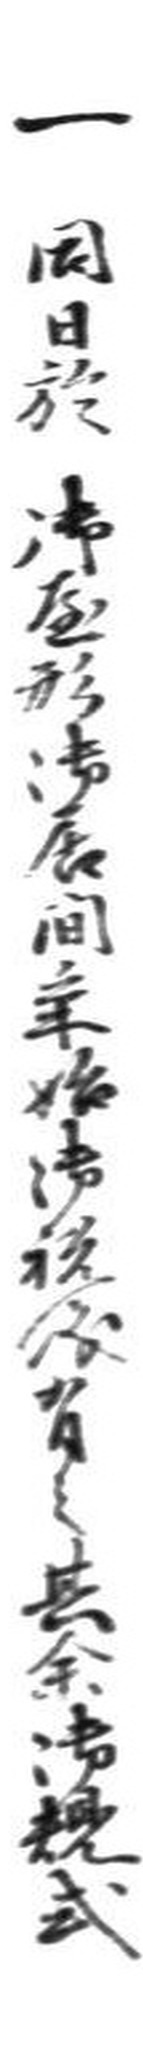一同日於御屋形御居間年始御祝儀有之其余御規式
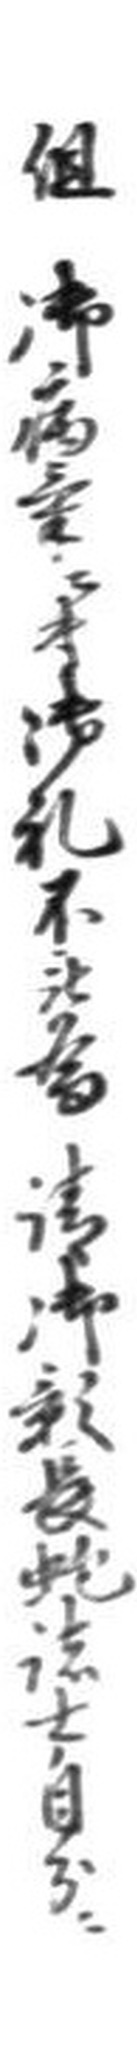但御病気ニ付御礼不被為請御影長蚫諸士自分ニ
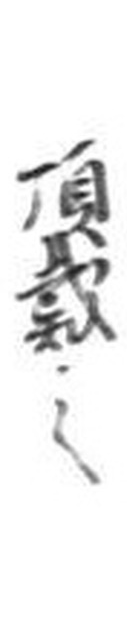頂戴之
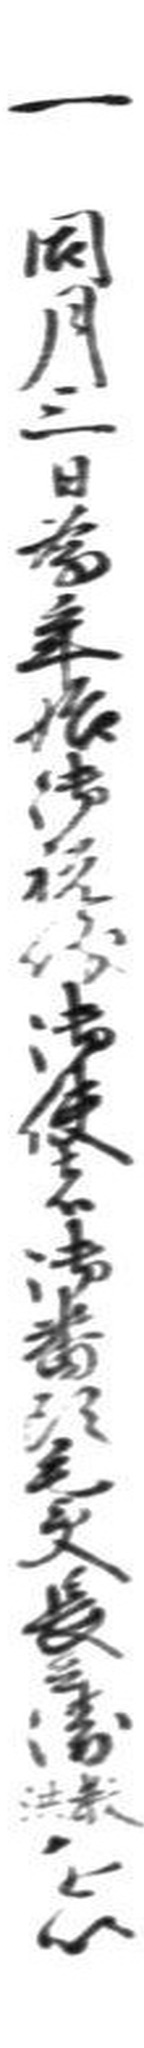一同月三日為年始御祝儀御使者御番頭毛受長兵衛教洪を以

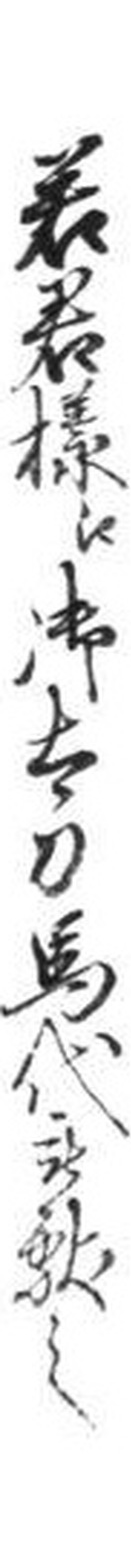若君様江御太刀馬代被献之
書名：家譜 十五 綱昌公 従天和元年到元禄十二年
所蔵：福井県文書館 Fukui Prefectural Archives
